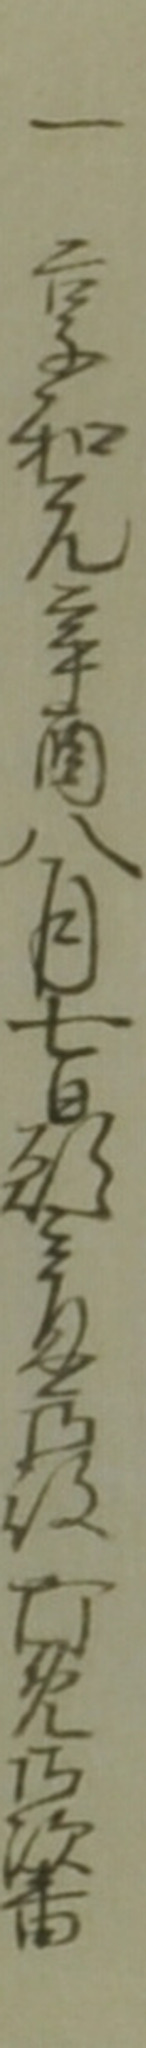一享和元辛酉八月七日願之通御役御免御次番
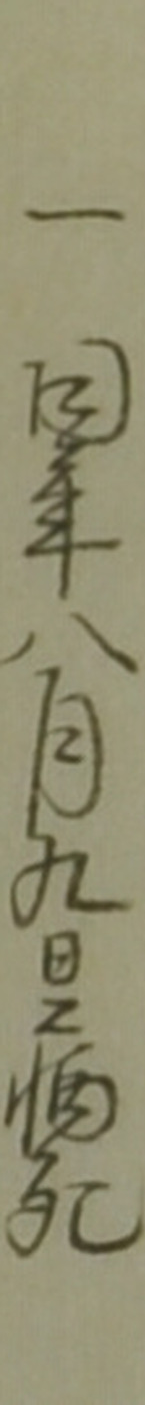一同年八月九日病死
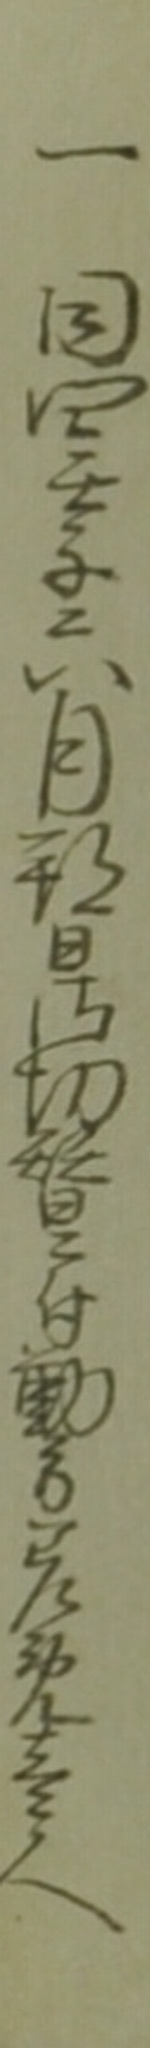一同四壬子六月朔日御切替ニ付勤方差免壱人
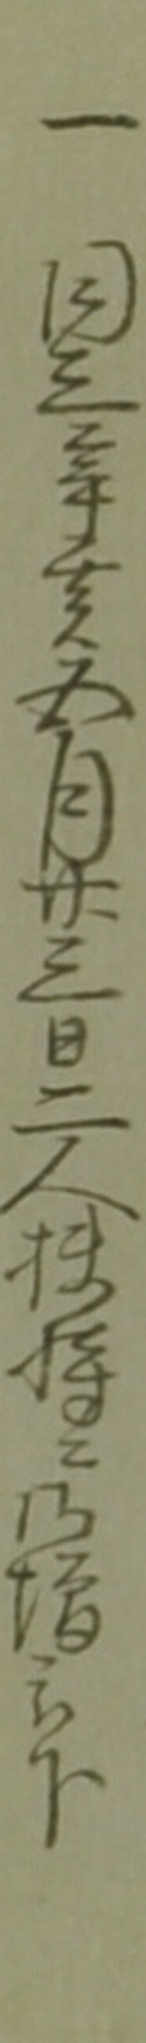一同三辛亥五月廿三日二人扶持ニ御増被下

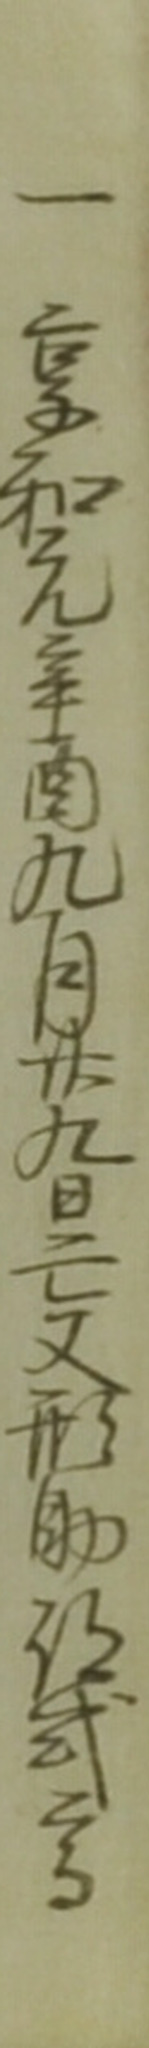一享和元辛酉九月廿九日亡父形助跡式高
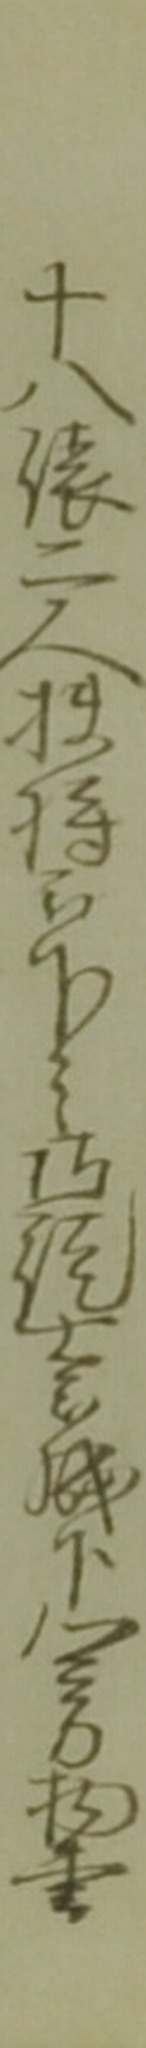十八俵二人扶持被下之御徒士被成下郷組方物書
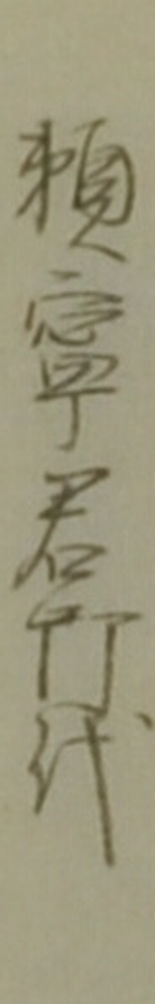頼寧君御代
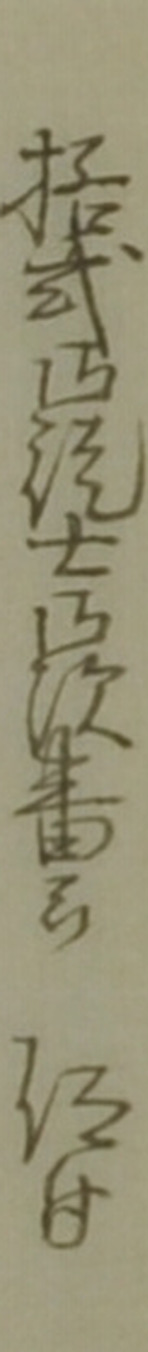格式御徒士御次番被仰付
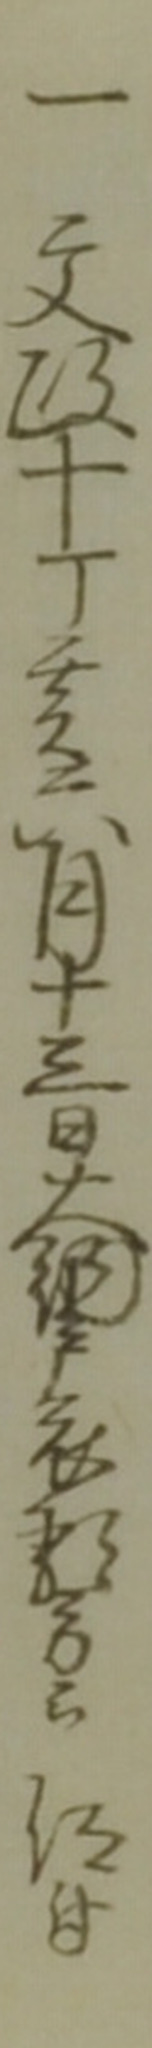一文政十丁亥六月十三日大納戸衣類方被仰付
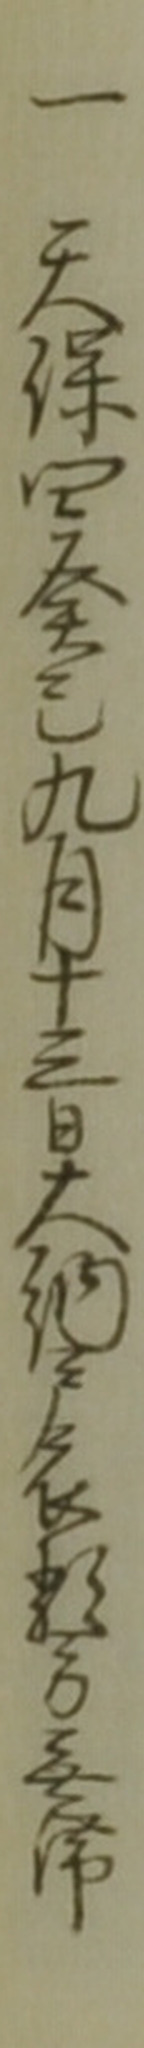一天保四癸巳九月十三日大納戸衣類方無滞
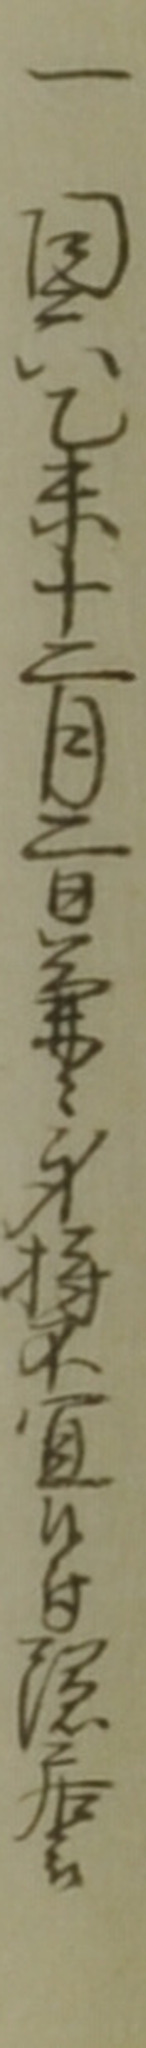一同六乙未十二月二日兼々身持不宜候付隠居被
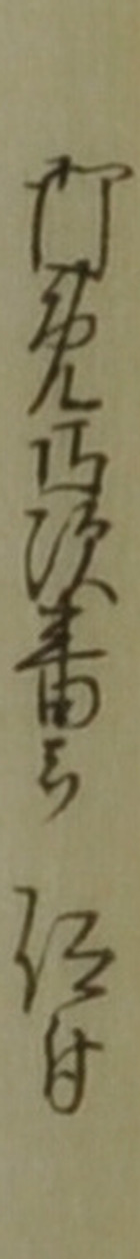御免御次番被仰付
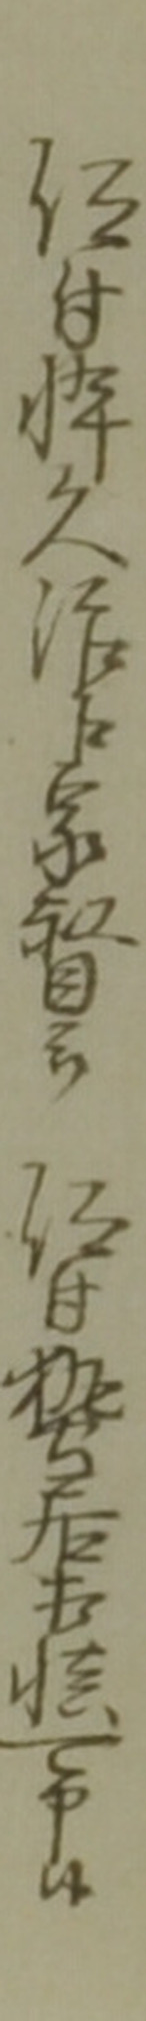仰付忰久治江家督被仰付蟄居相慎可申候
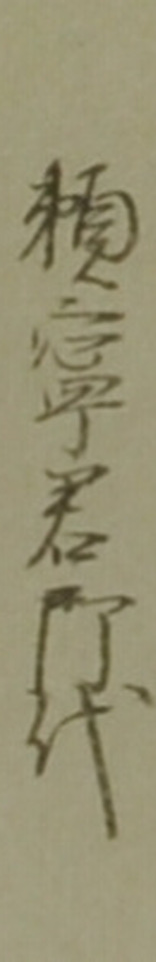頼寧君御代
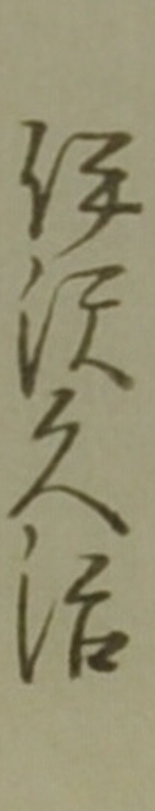伊沢久治
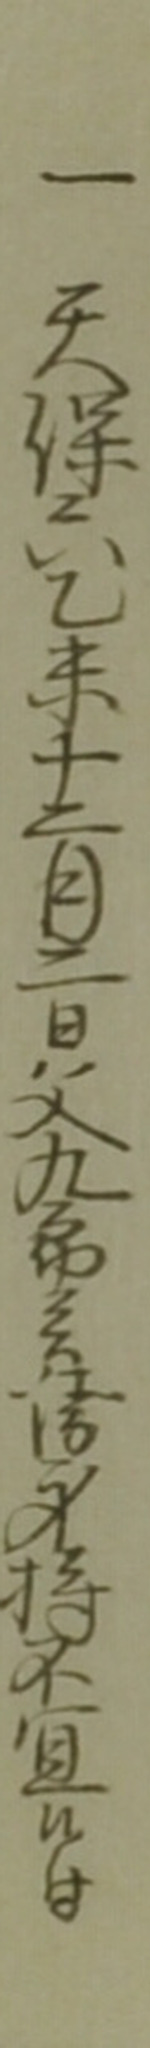一天保六乙未十二月二日父九郎兵衛身持不宜候付
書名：無足諸士勤仕録（九）
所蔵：伊那市立高遠町図書館・合同会社AMANE
